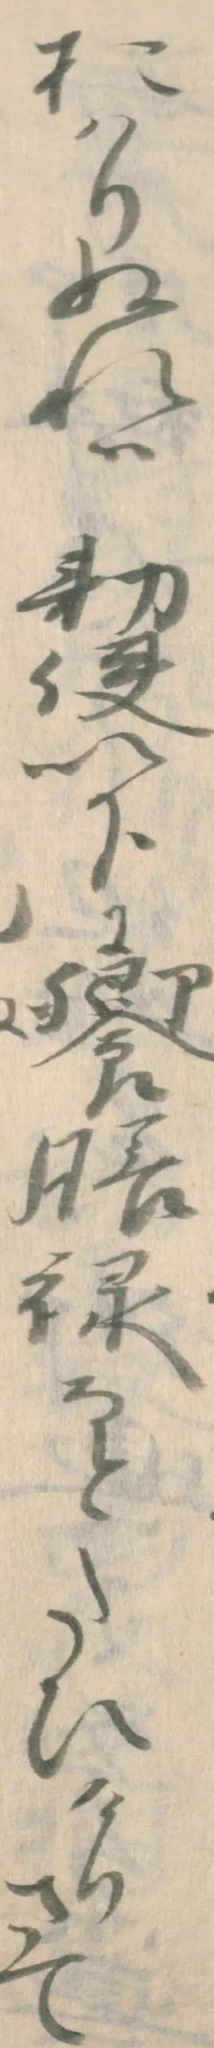おはりぬれは勅使以下に饗膳禄なとたひけりさて
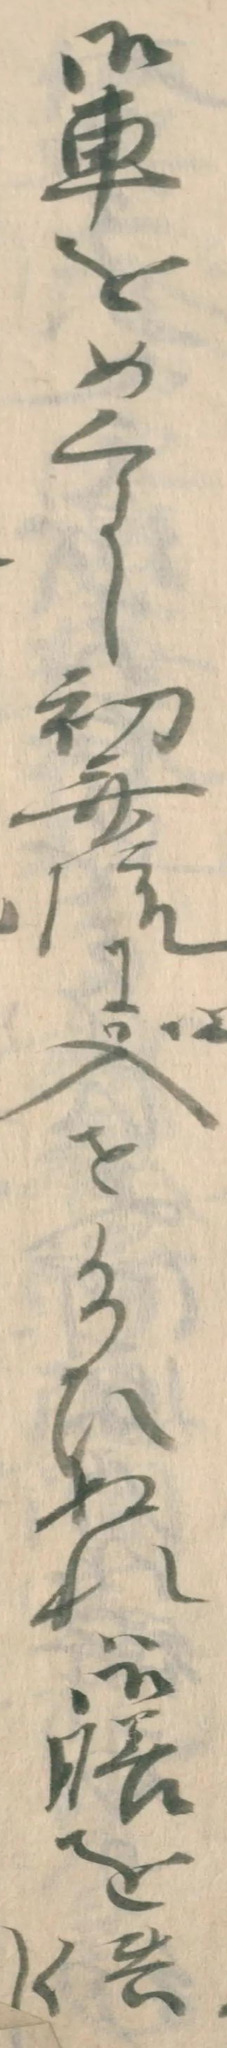御車をめくらし初斎院に◦入せ給ひぬれは御膳を供し

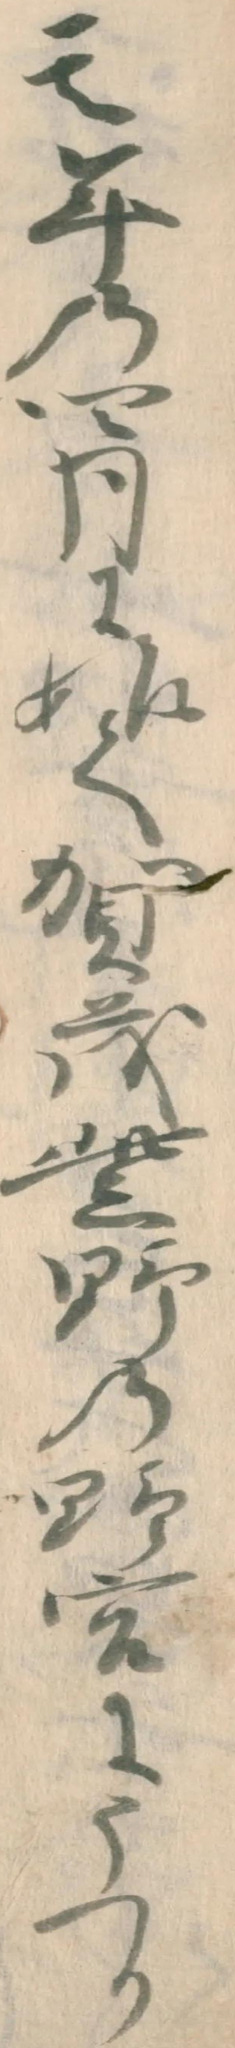其年の四月に始て賀茂紫野の野宮にうつり
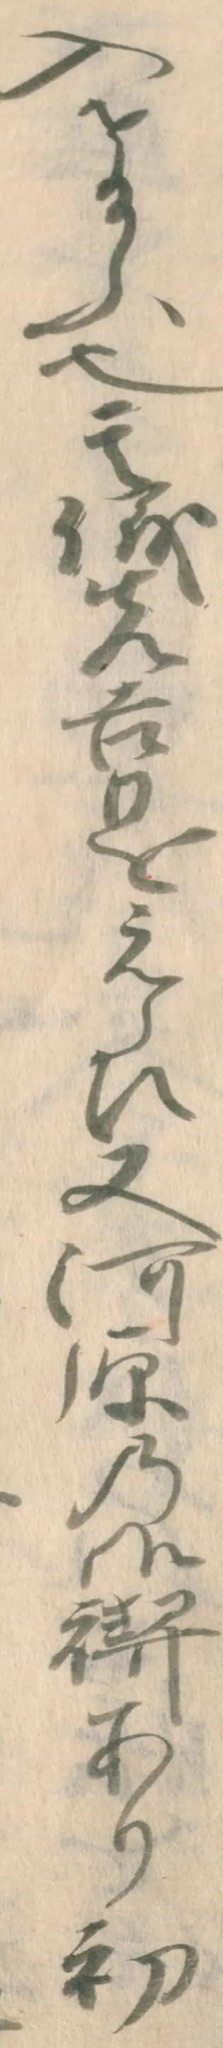入せ給ふ也其儀先吉日をえらひ又河原の御禊あり初
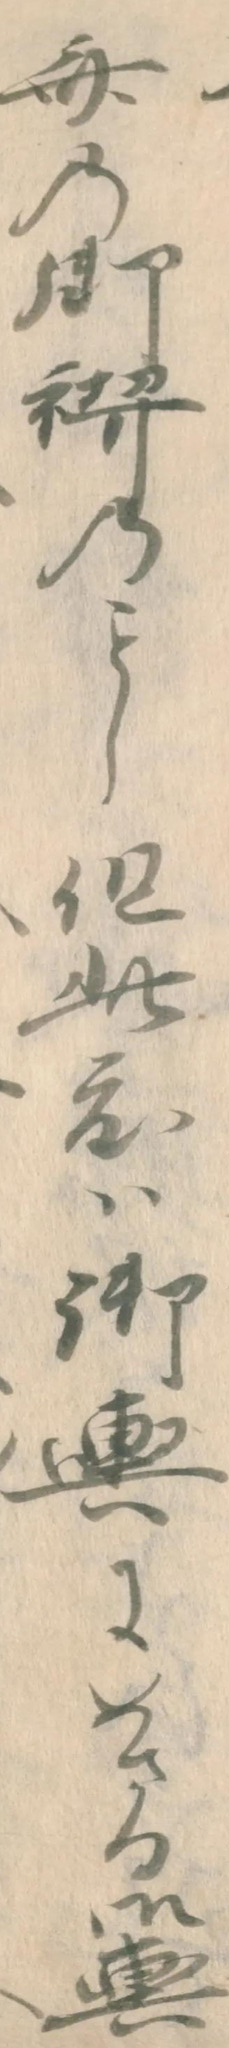斎の御禊のことし但此度は御輿にめさる御輿
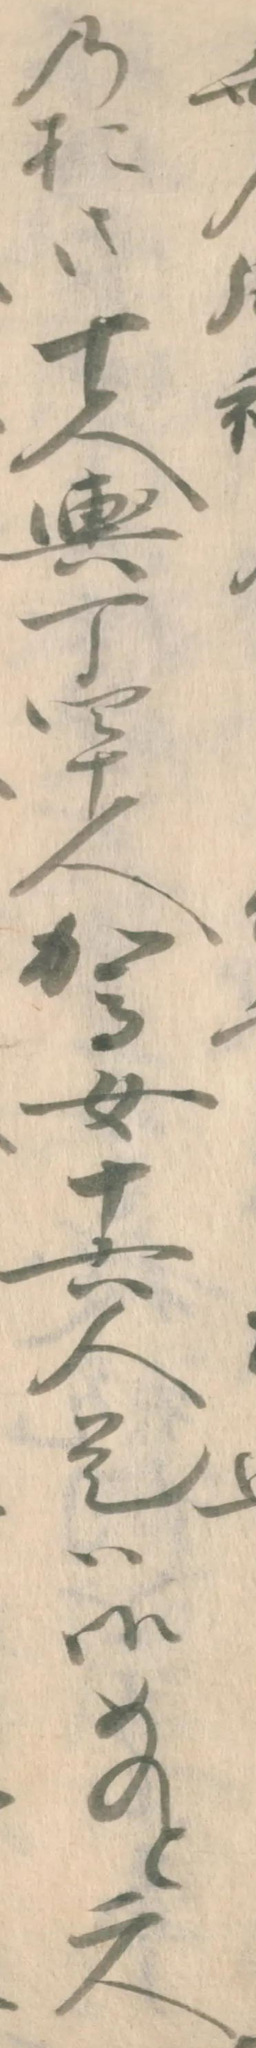のおさ十人輿丁四十人駕女十六人是は御めのと二人
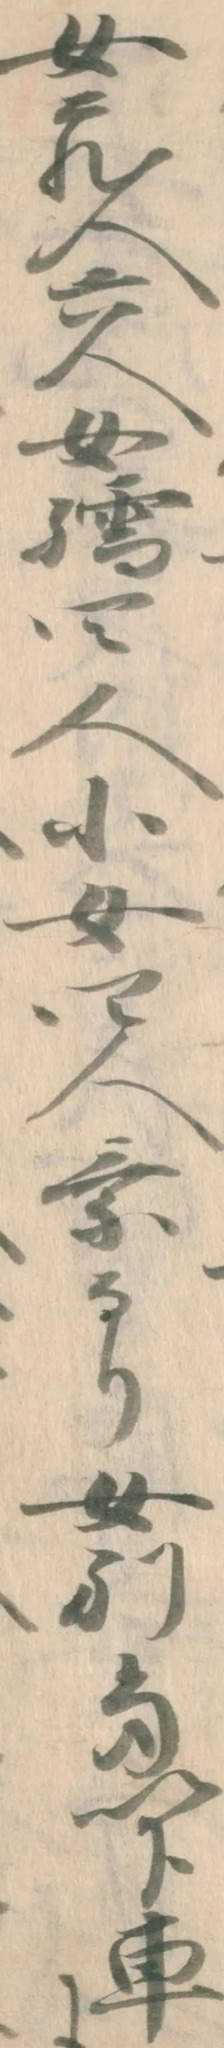女蔵人六人女嬬四人小女四人乗なり女別当以下車に
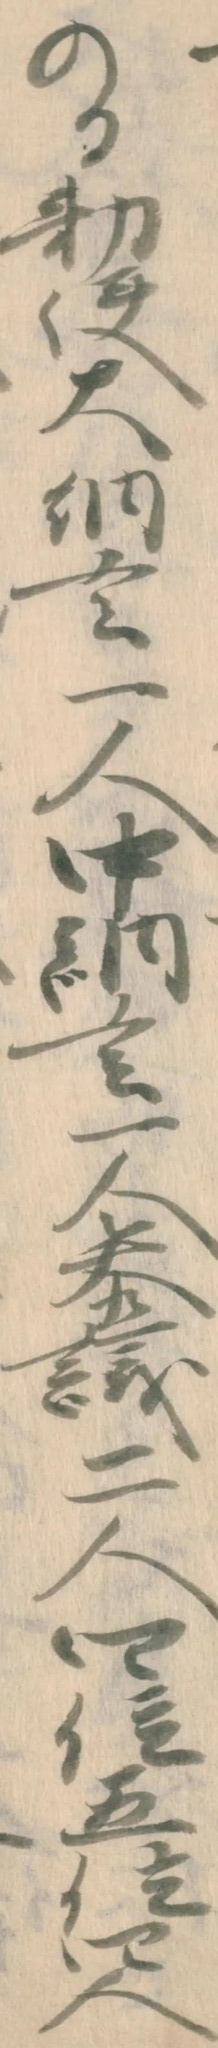のる勅使大納言一人中納言一人参議二人四位五位四人
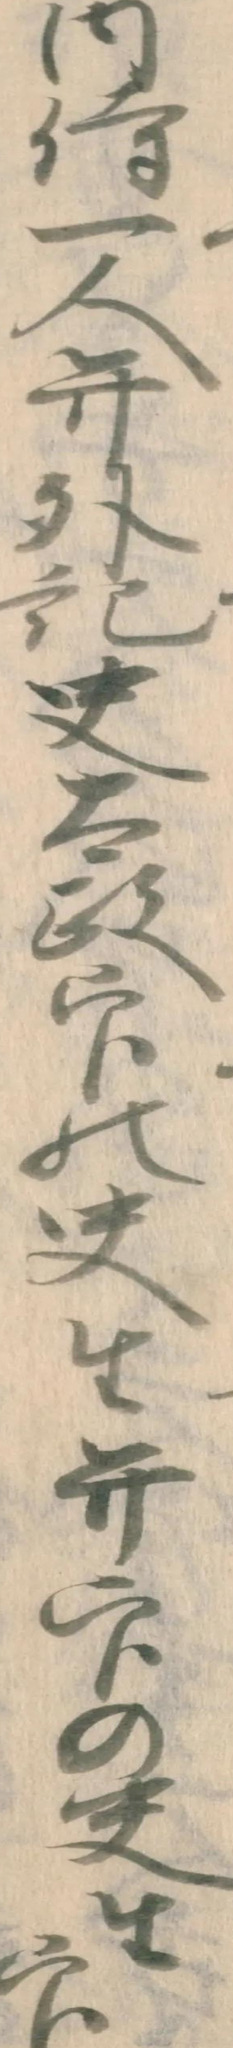内侍一人弁外記史太政官の史生弁官の史生官
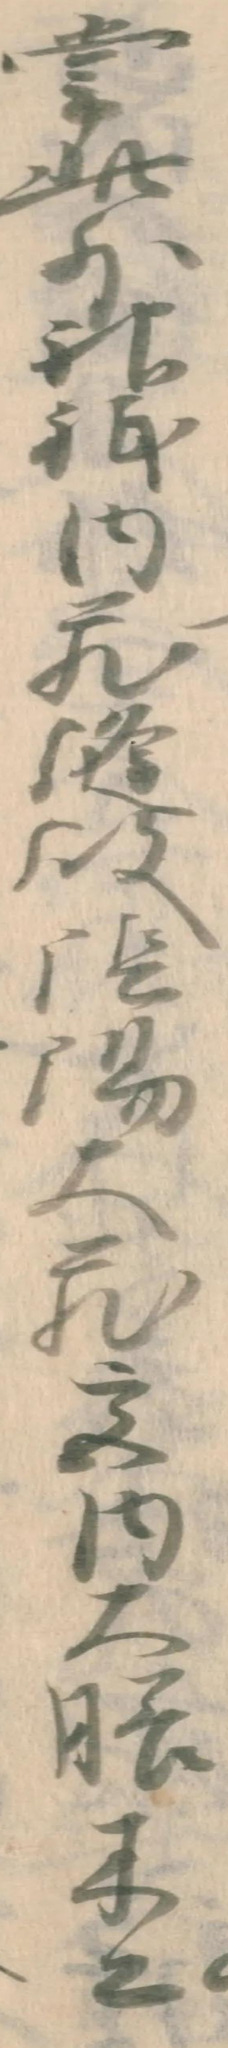掌此外神祇内蔵縫殿陰陽大蔵宮内大膳木工
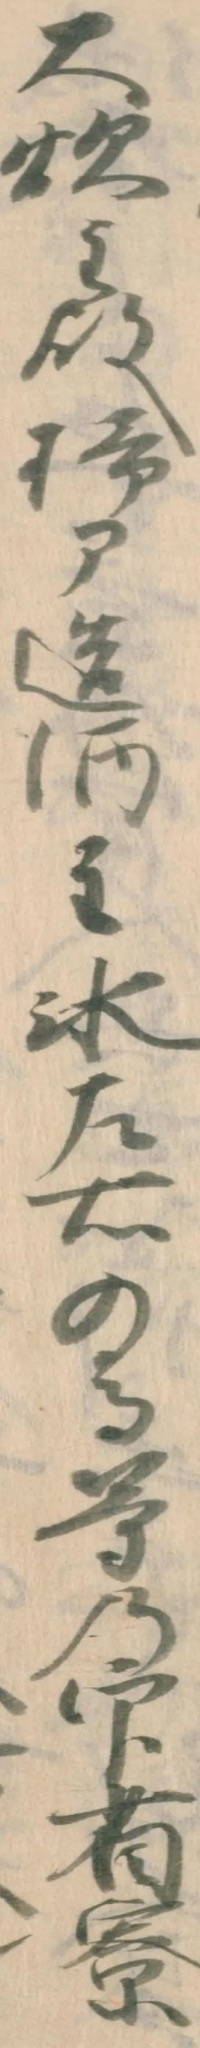大炊主殿掃部造酒主水左右の馬等の官省寮
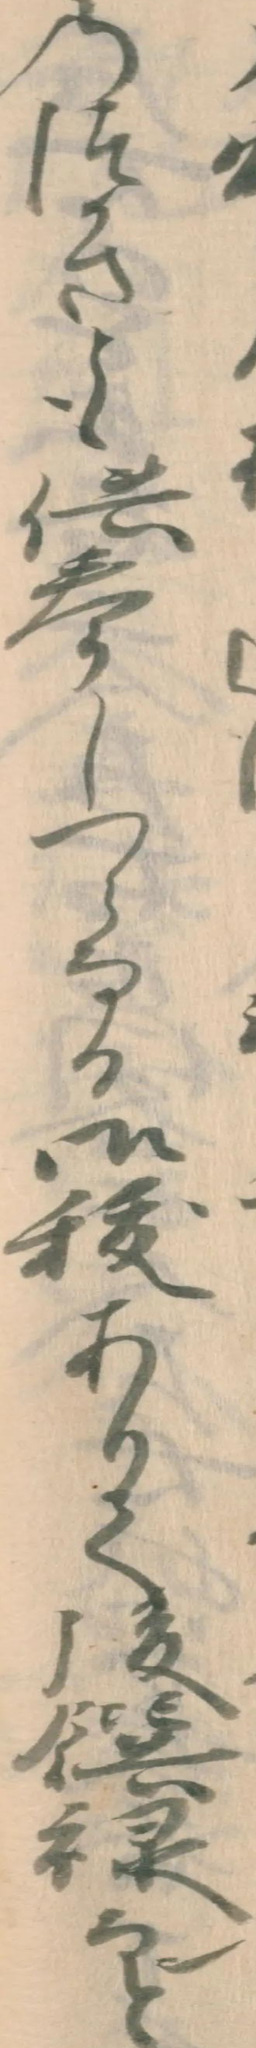のつかさとも供奉しつらなる御祓ありて後饌禄な
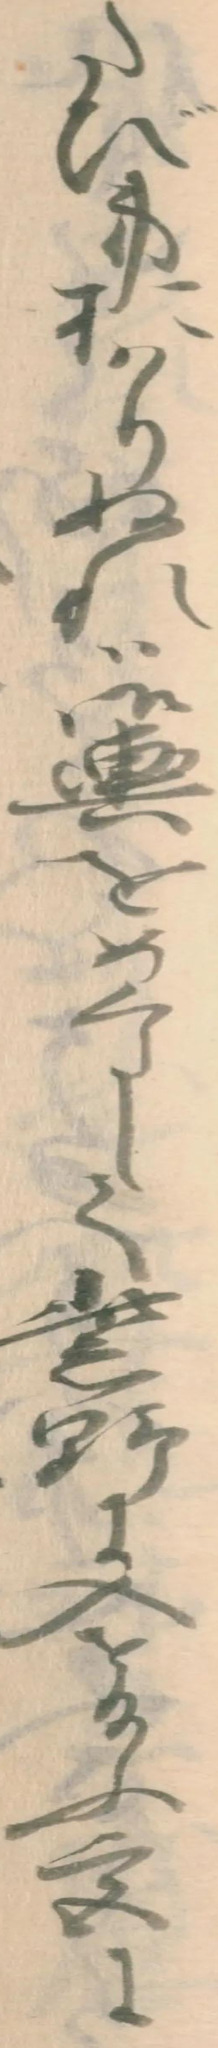たび事おはりぬれは御輿をめくらして紫野に入せ給ふ宮に
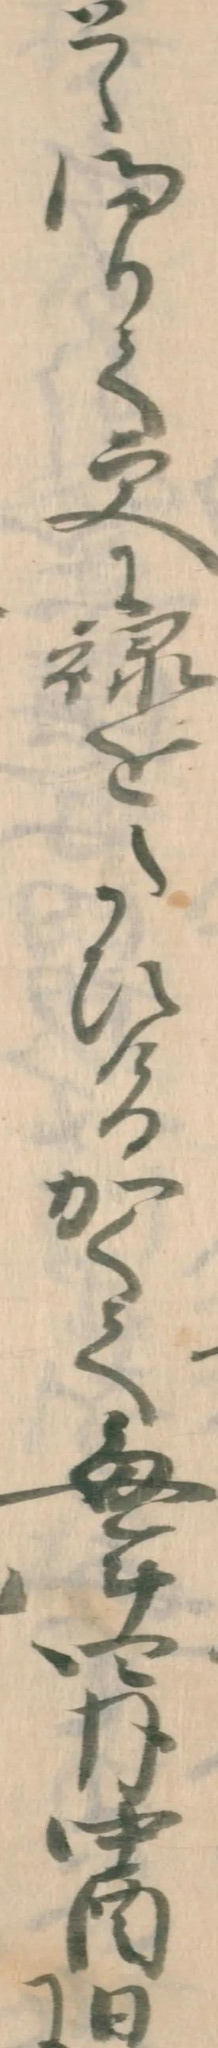とゝまりて更に禄をたひけるかくて毎年四月中酉日に
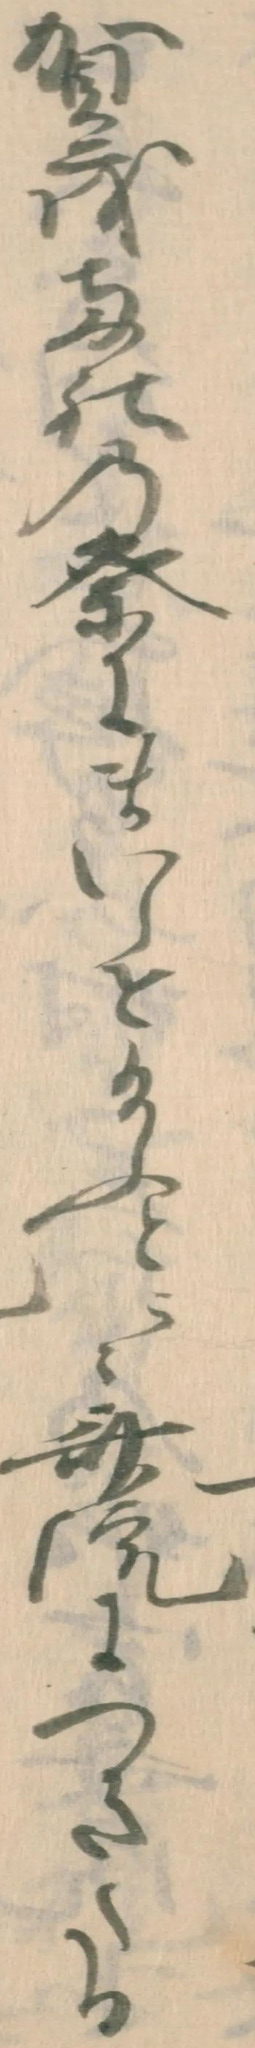賀茂両社の祭にまいらせ給ふと云々斎院につきたる
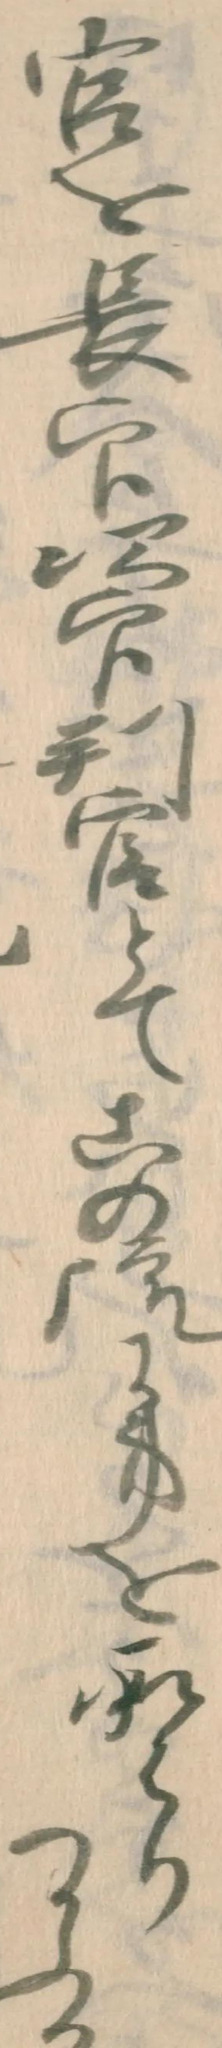官を長官次官判官とてこの院に事を承はり給ふる
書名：賀茂社記録. 第1冊
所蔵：国立国会図書館 National Diet Library, JAPAN
